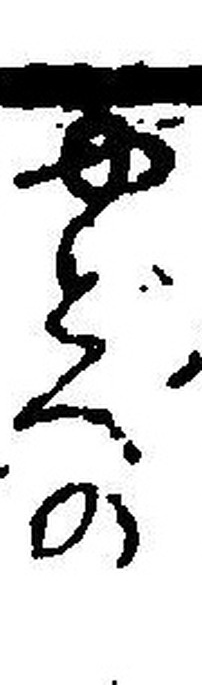やどへの
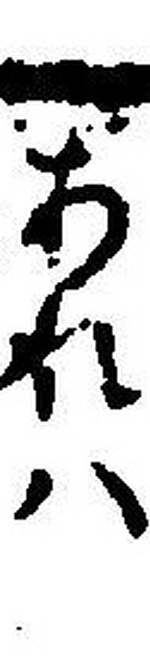あれは
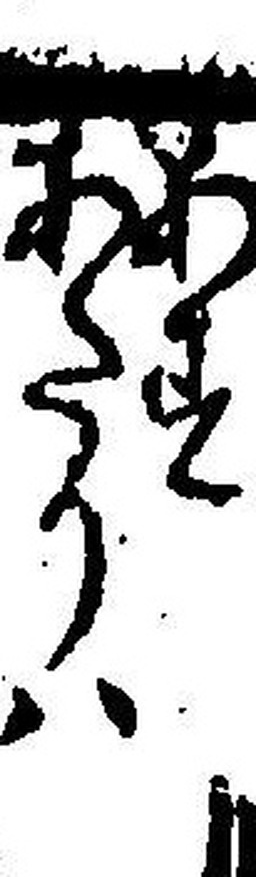あたりは
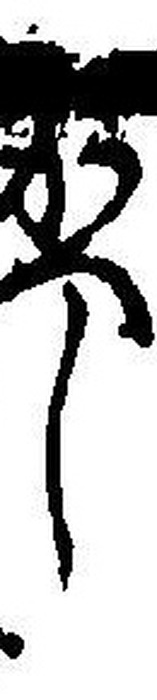かへし
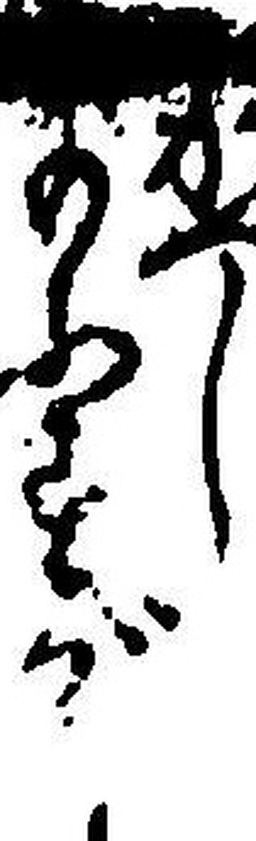もふすが
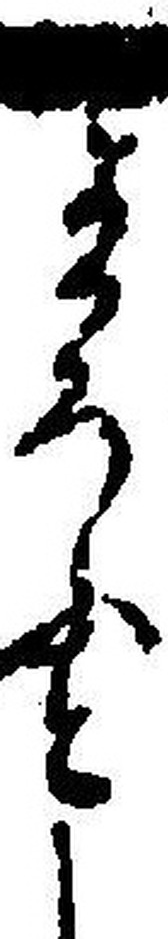よかろふと
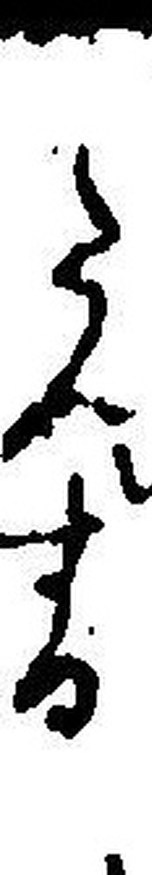たんする

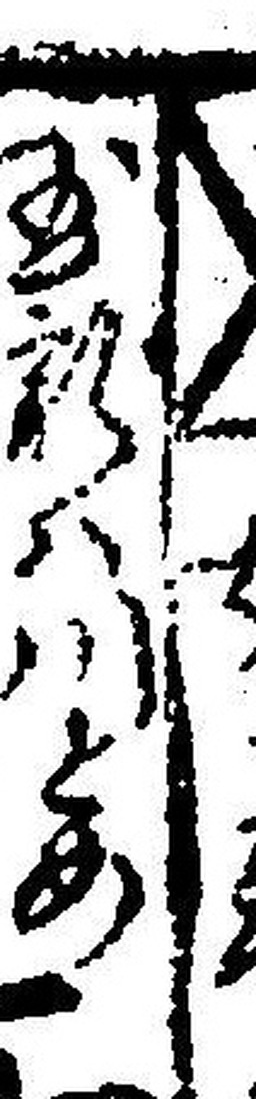玉新は川とめ
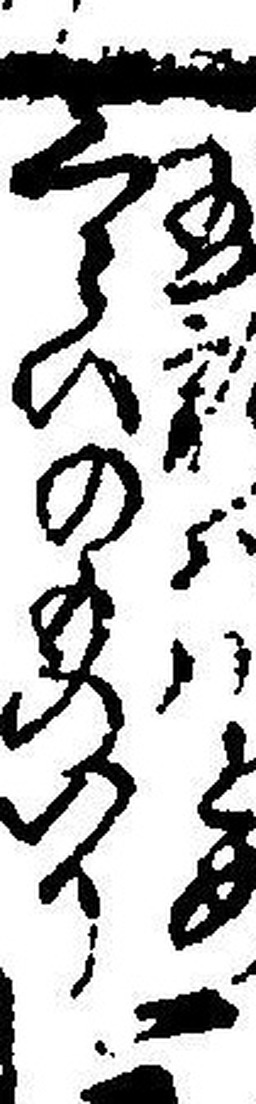くらいのものいり
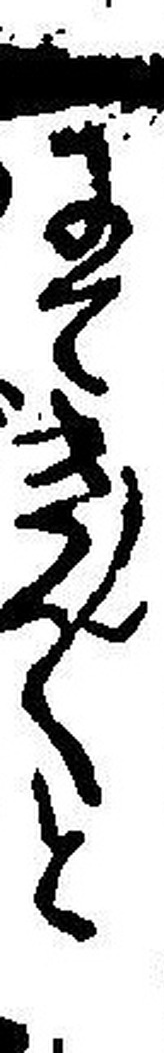にてきん〳〵と
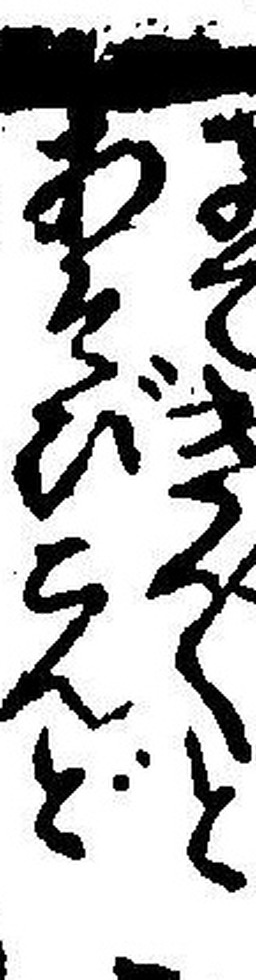あそびこんど
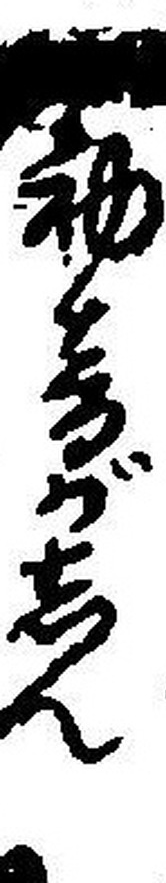初音がしん
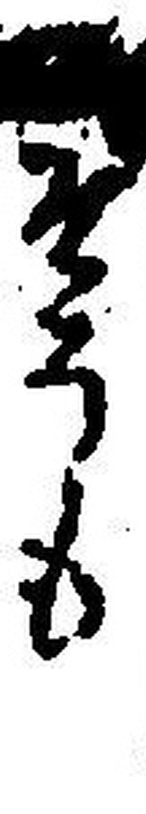ぞうも
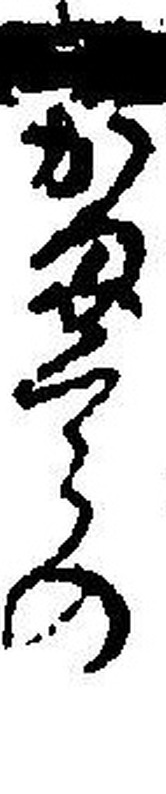かまくらの
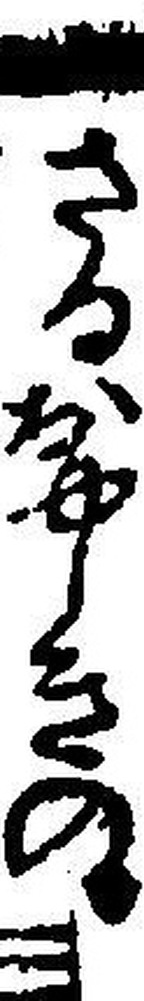さるおやしきの
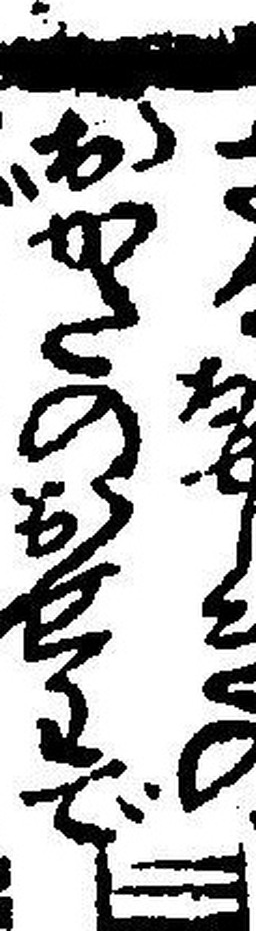おかたのおせわで
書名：間違狐之女郎買 / 市場通笑作
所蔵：東京大学総合図書館 General Library in the University of Tokyo, JAPAN
